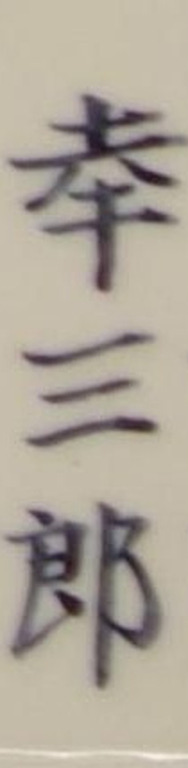幸三郎
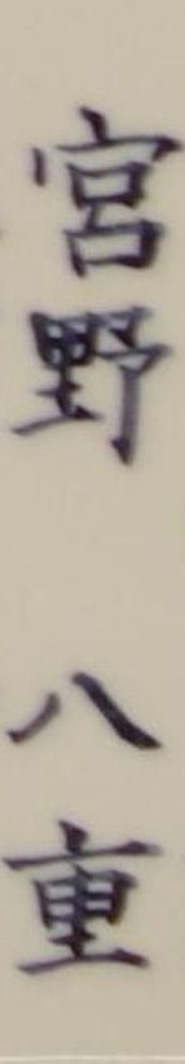宮野八重
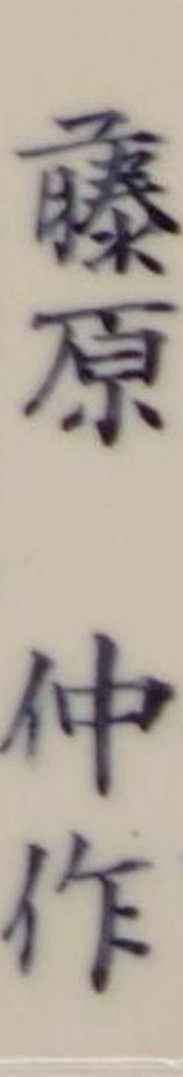藤原仲作
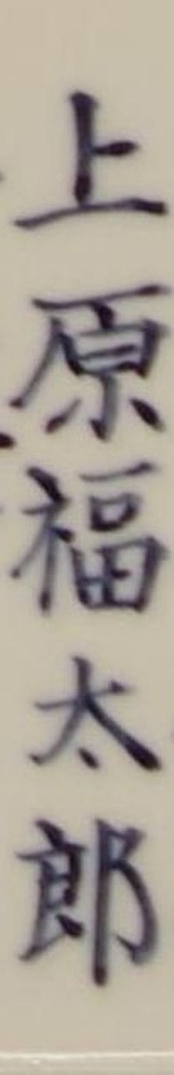上原福太郎
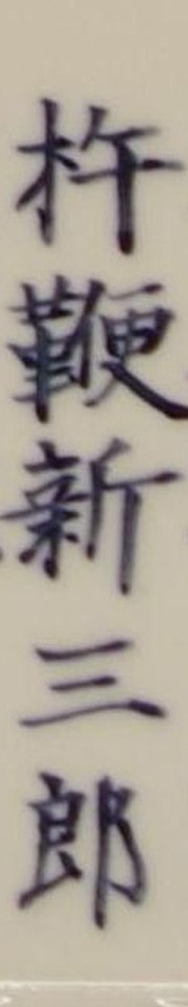杵鞭新三郎
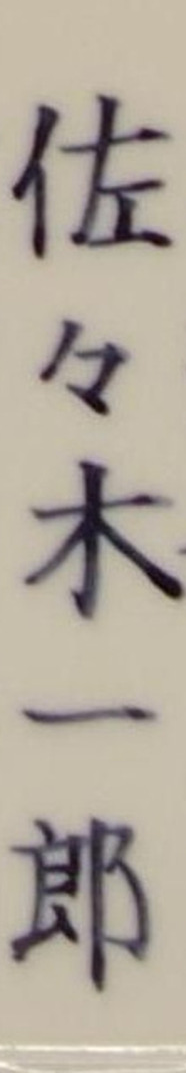佐々木一郎
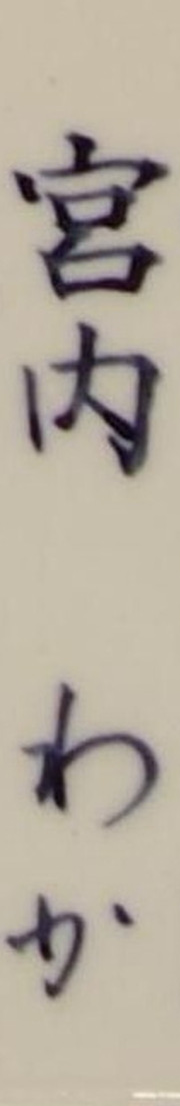宮内わか
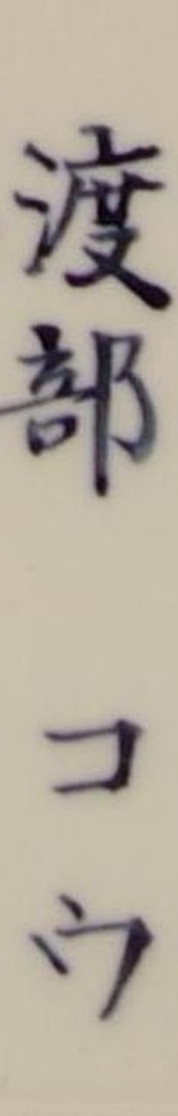渡部コウ
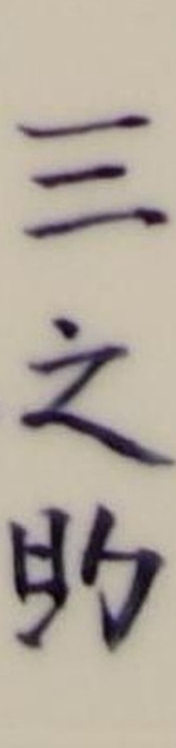三之助
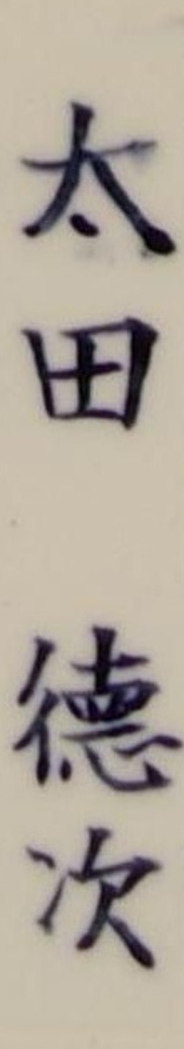太田徳次
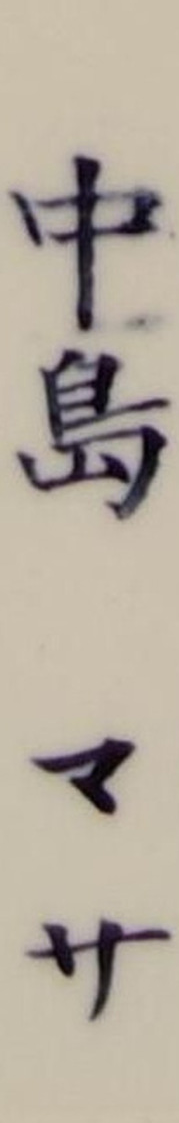中島マサ
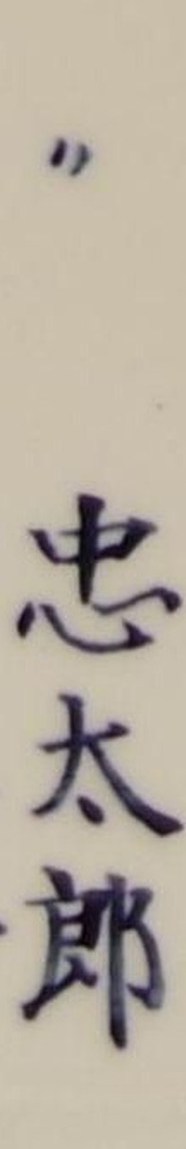忠太郎
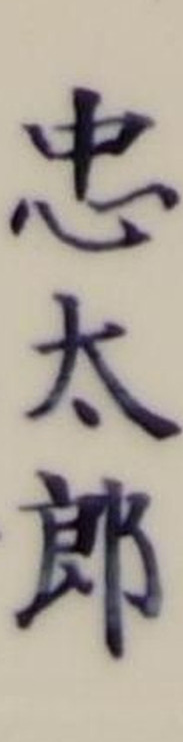忠太郎
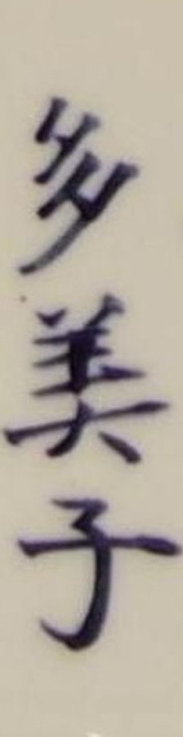多美子
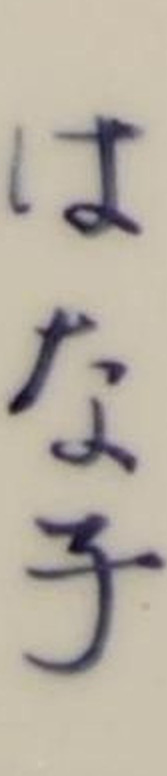はな子
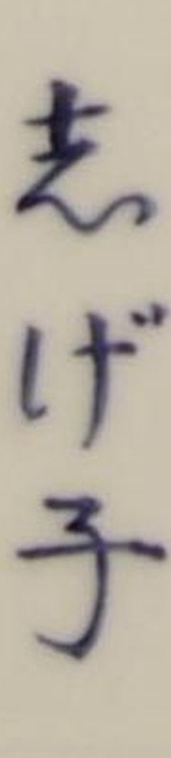しげ子
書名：M~S
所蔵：高野山金剛峯寺
